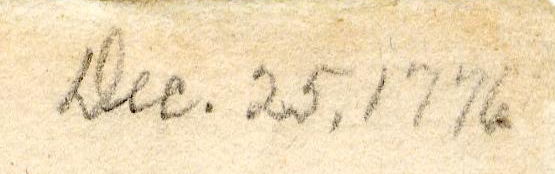Dec. 25. 1776
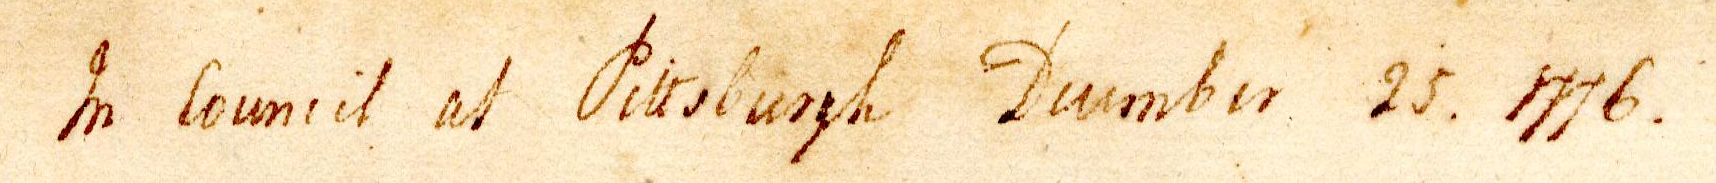In Council at Pittsburgh December 25. 1776.
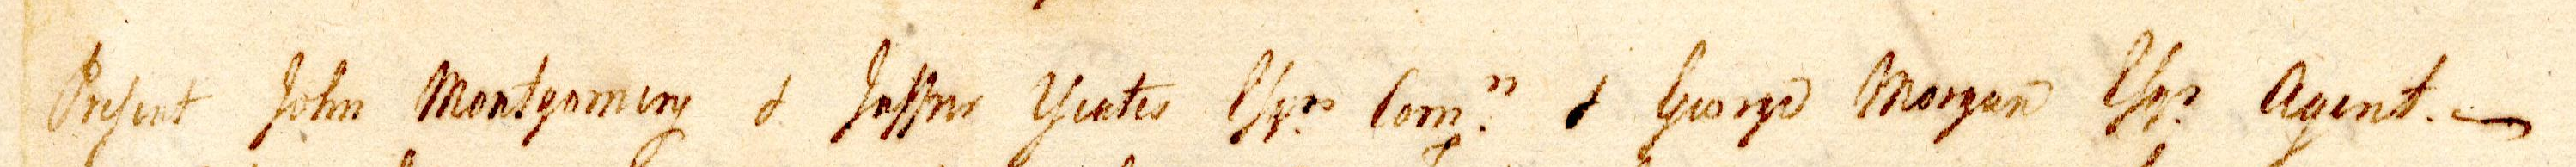Present John Montgomery & Jasper Yeates Esq. Com^r. & George Morgan Esq. Agent.-
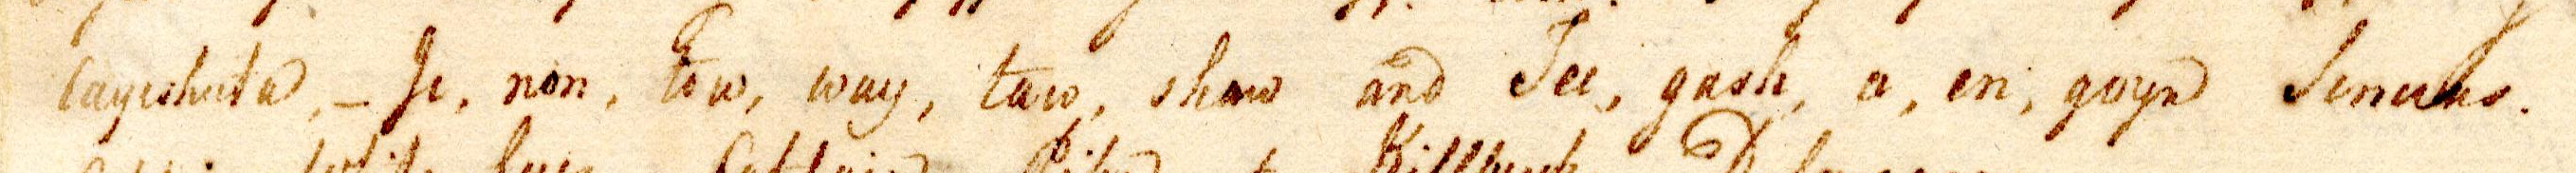Cayeshuta,- Je, non, tow, way, taw, show and Tee, gash, a, en, goyn Senecas.
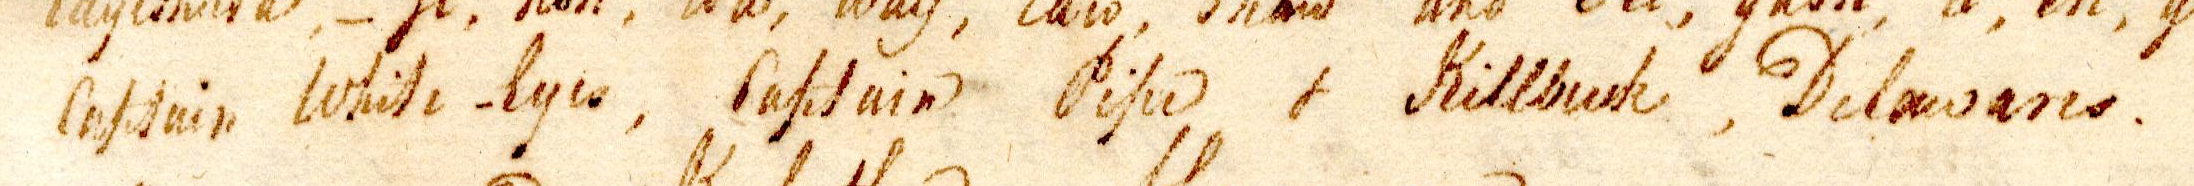Captain White-Eyes, Captain Pipe, & Killbuck, Delawares.
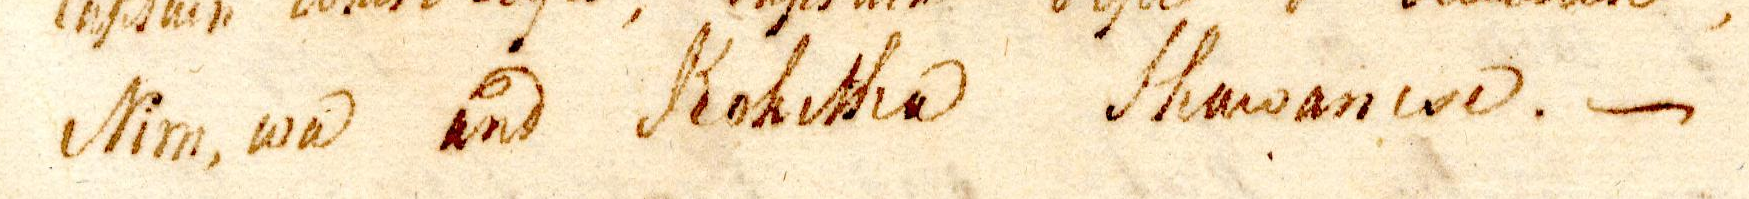Nim, wa and Koketha Shawanese.-
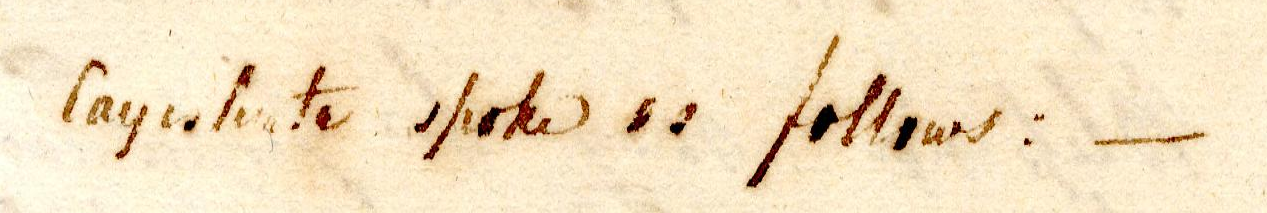Cayeshuta spoke as follows:-
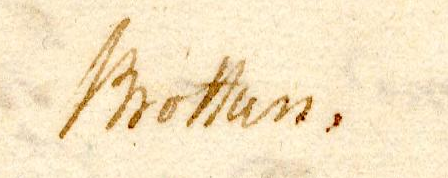Brothers,
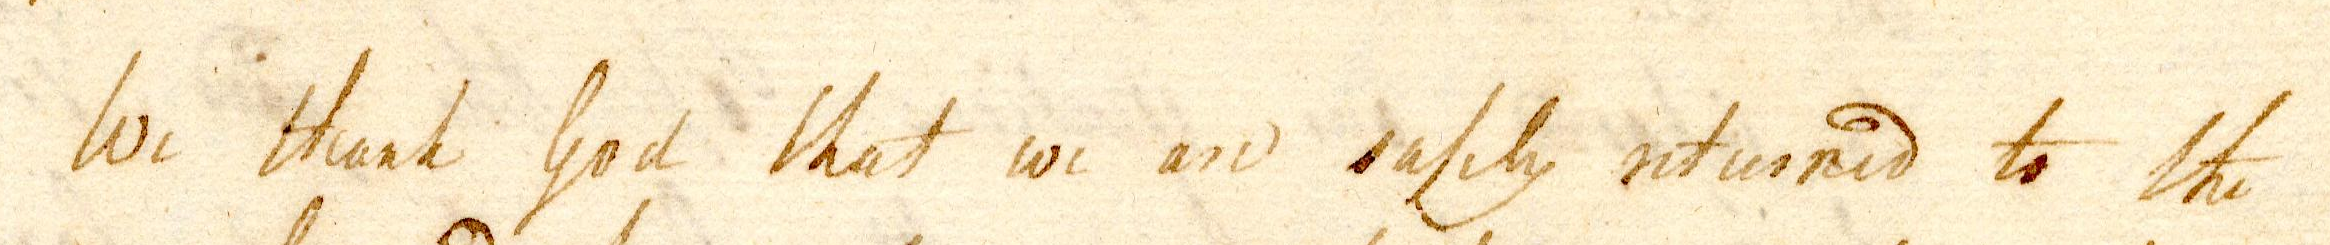We thank God that we are safely returned to the
